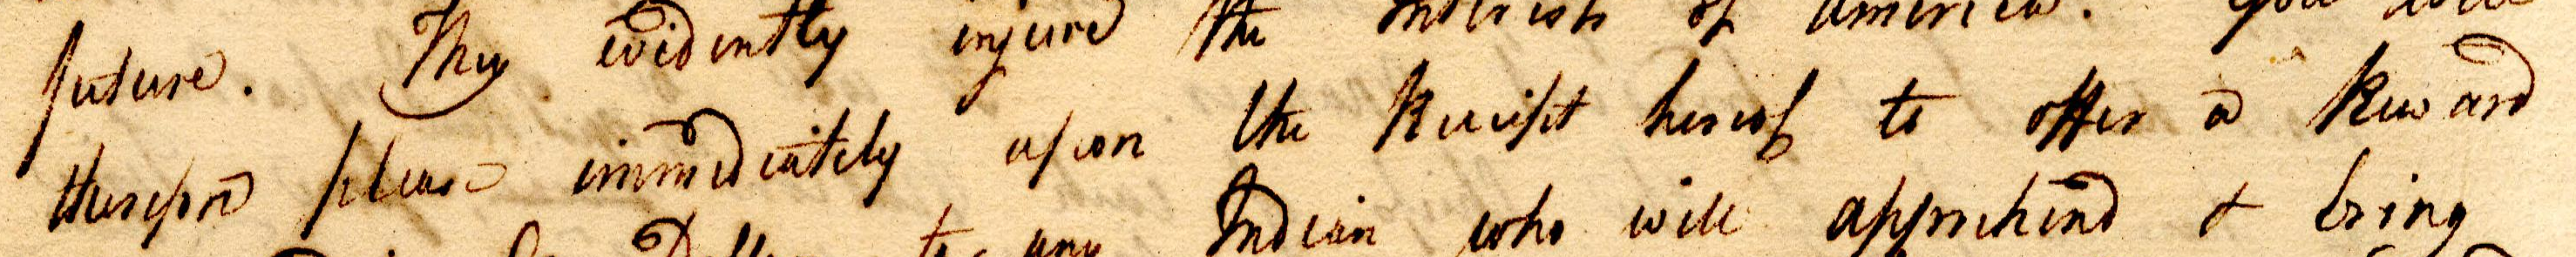therefore please immediately upon the Receipt hereof to offer a Reward
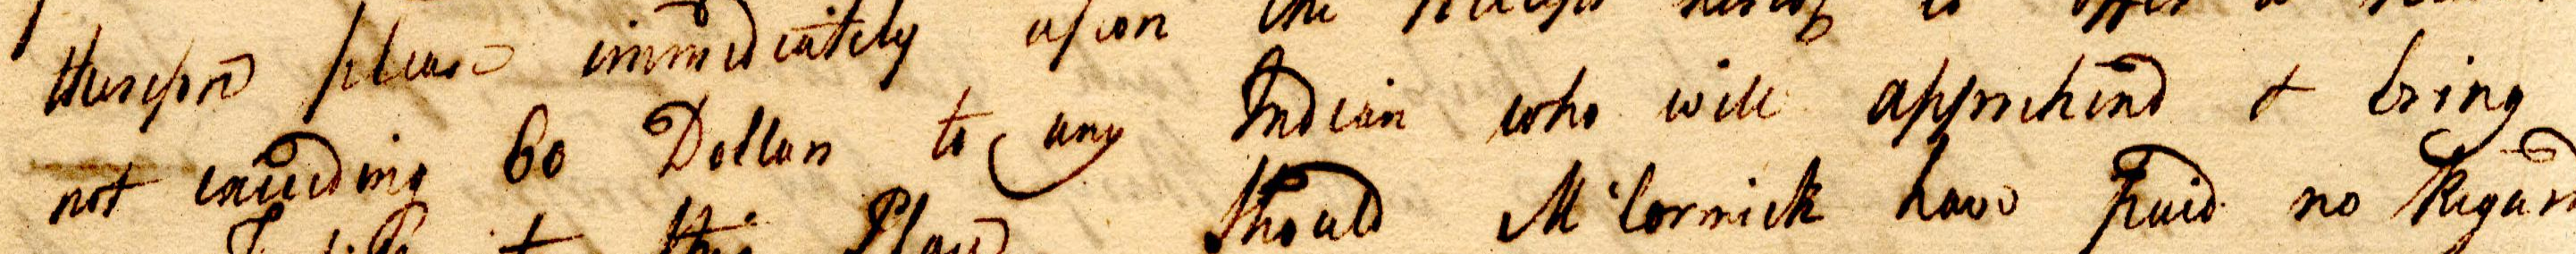not exceeding 60 Dollar to any Indian who well apprehend & bring
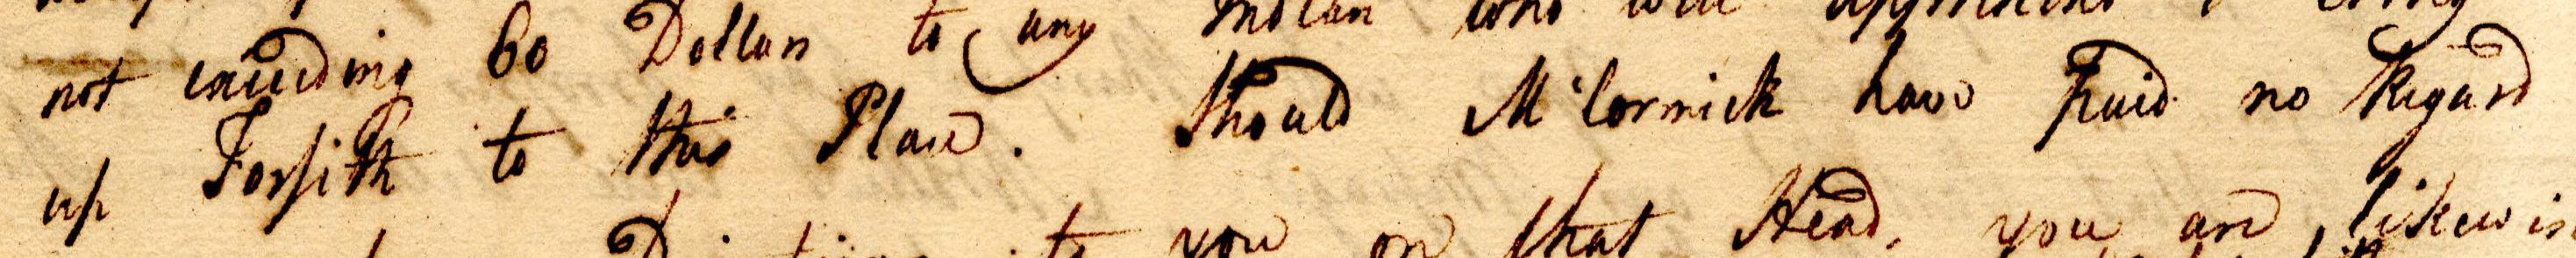up Forsith to this Place. Should McCormick have paid no Regard
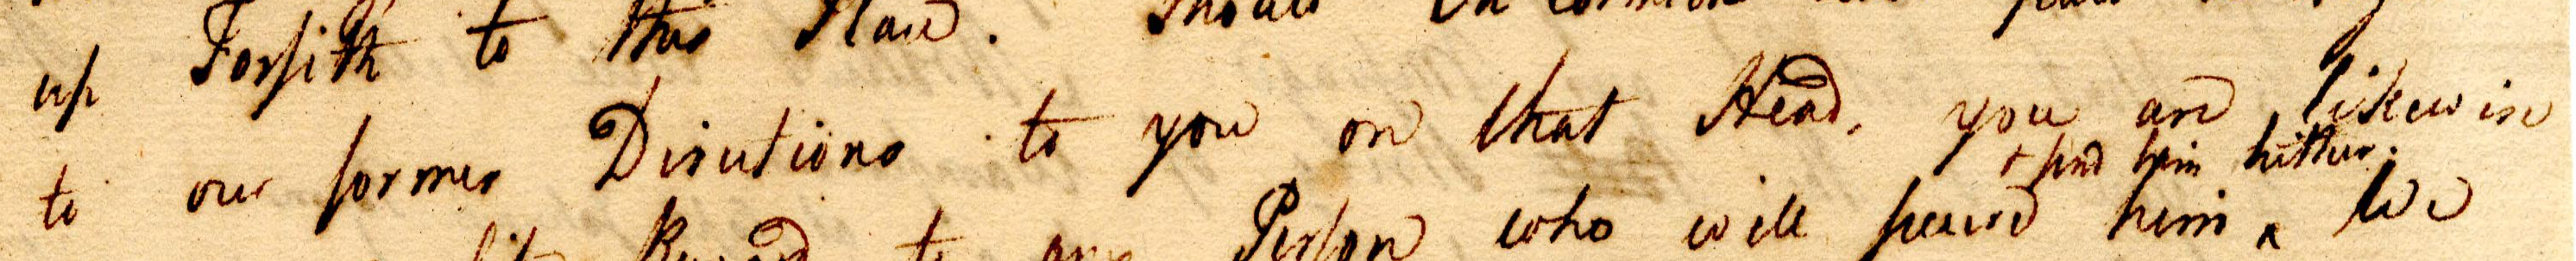to our former Directions to you on that Head, you are likewise
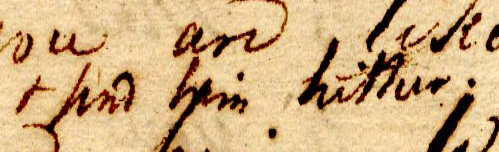& send him hither
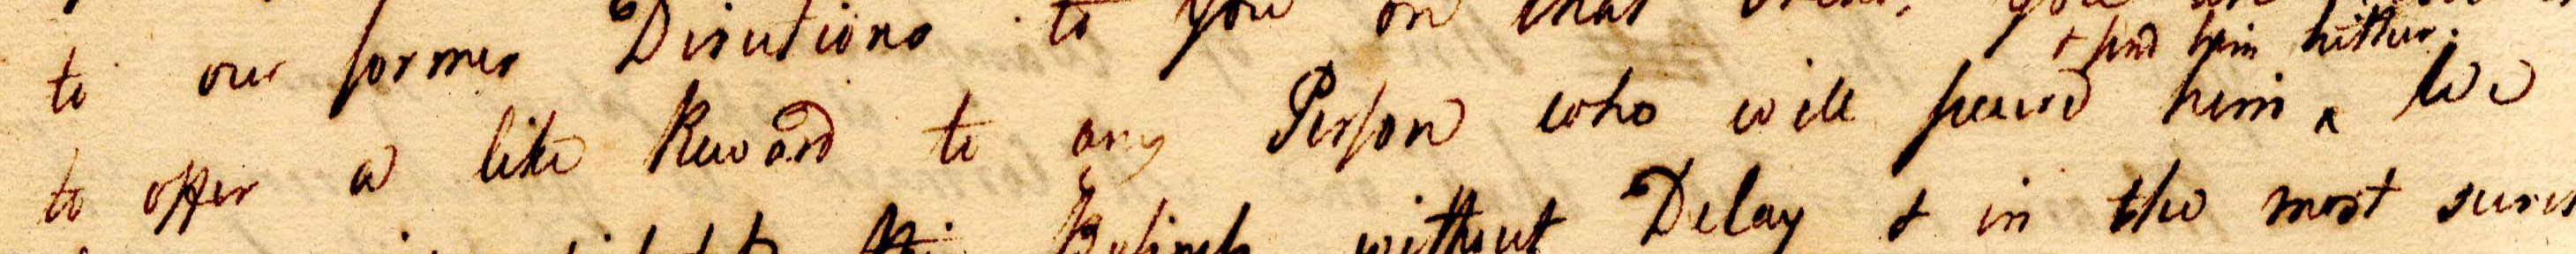to offer a like Reward to any Person who will pursue him ^. We
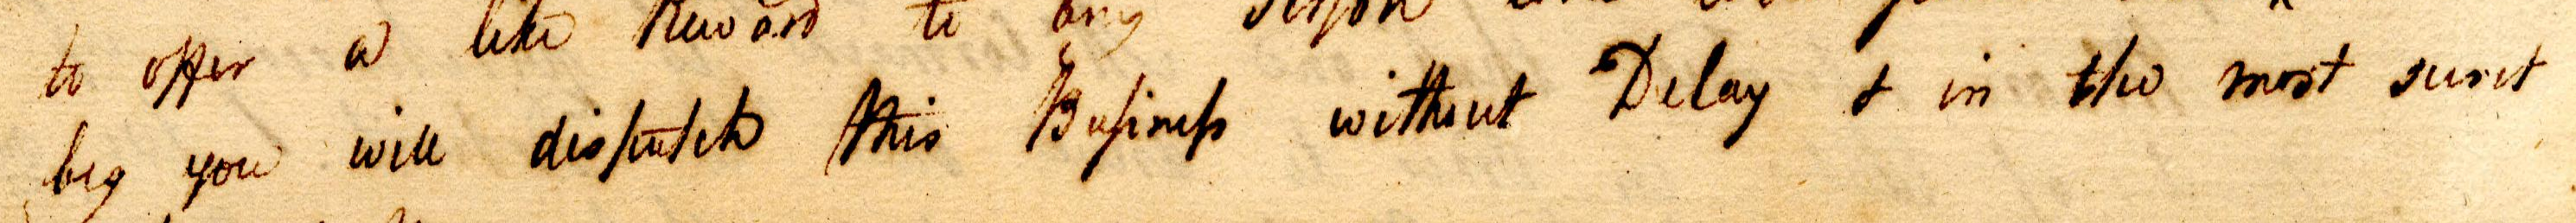beg you will dispatch this Business without Delay & in the most secret
